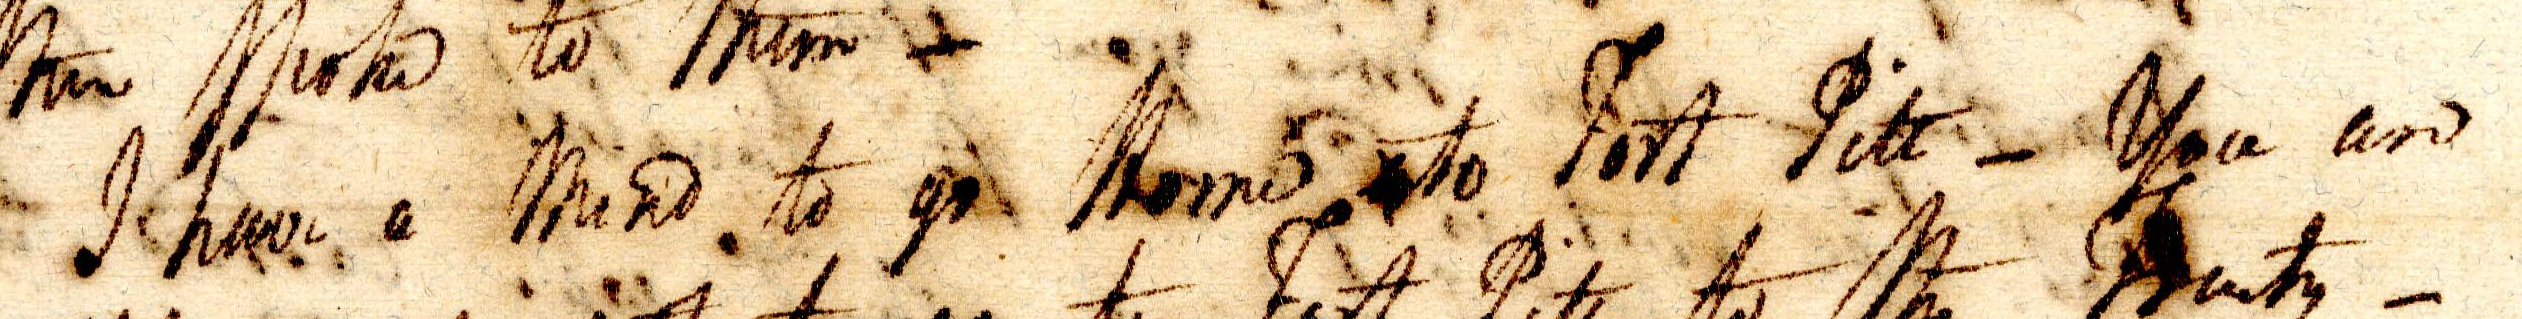I have a Mind to go Home to Fort Pitt- You are
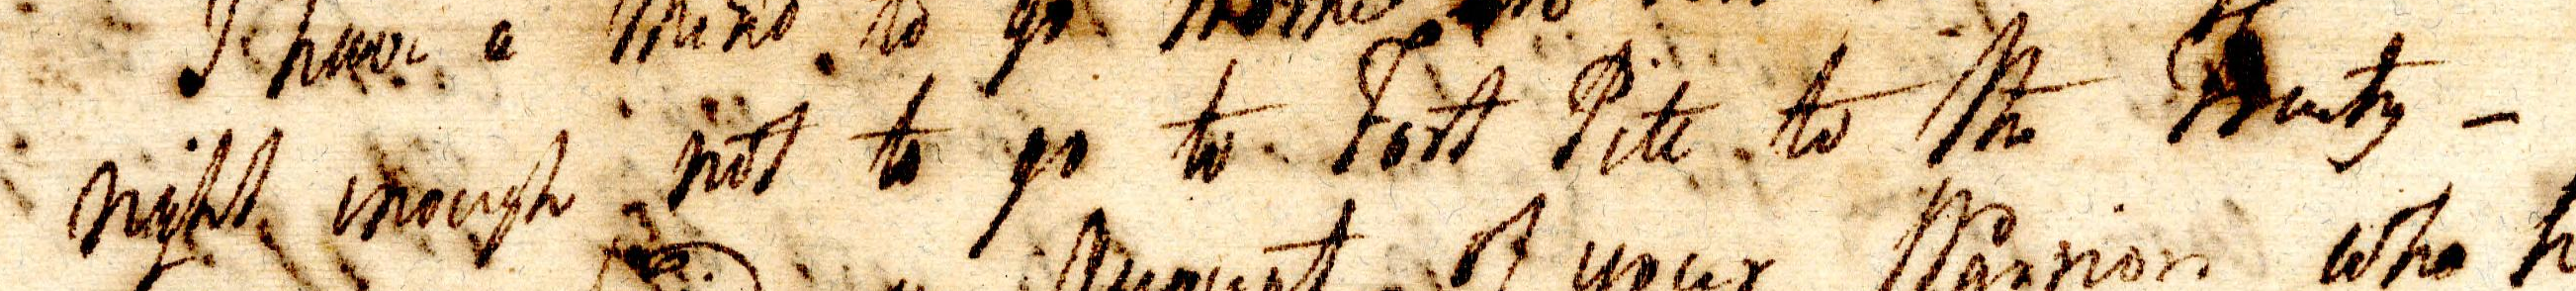right enough not to go to Fort Pitt to the Treaty-
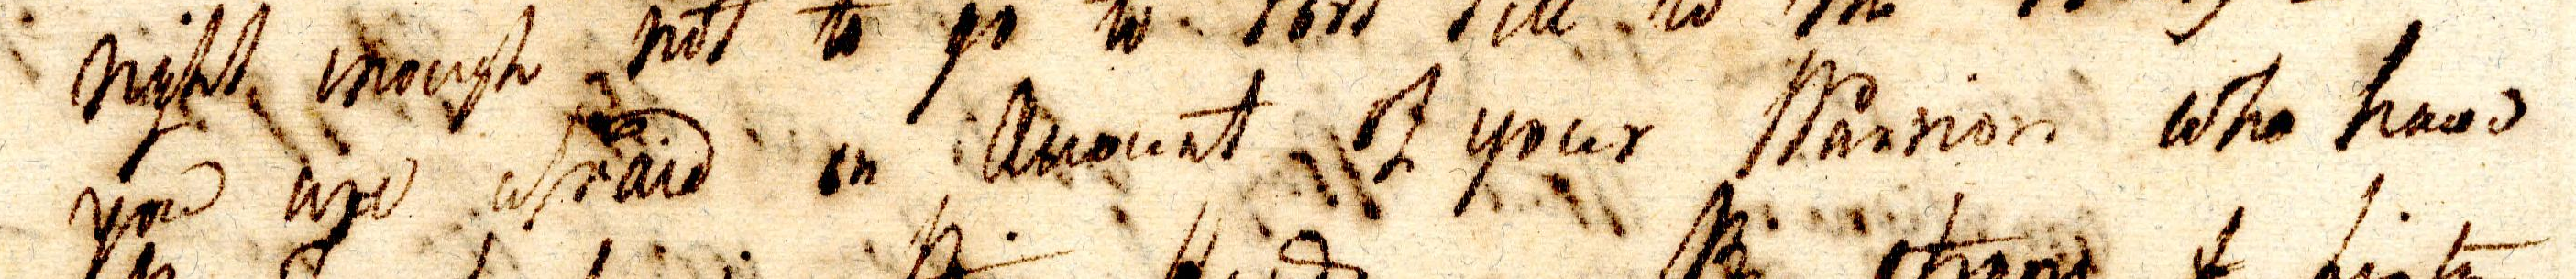you are afraid on Account of your Warriors who have
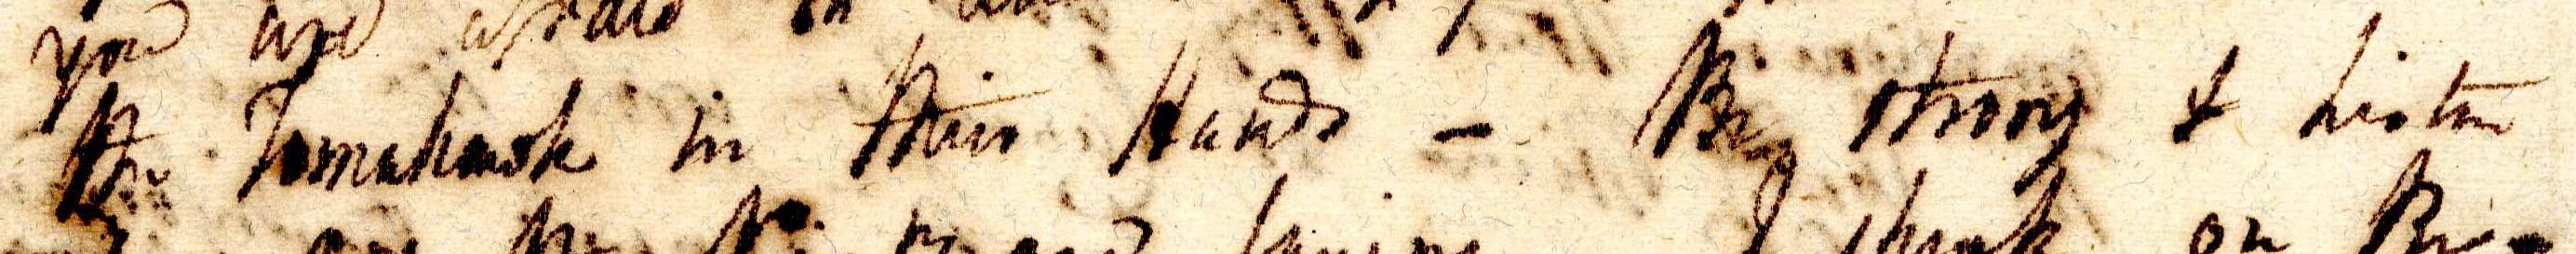the Tomahawk in their Hands- Be strong & Listen
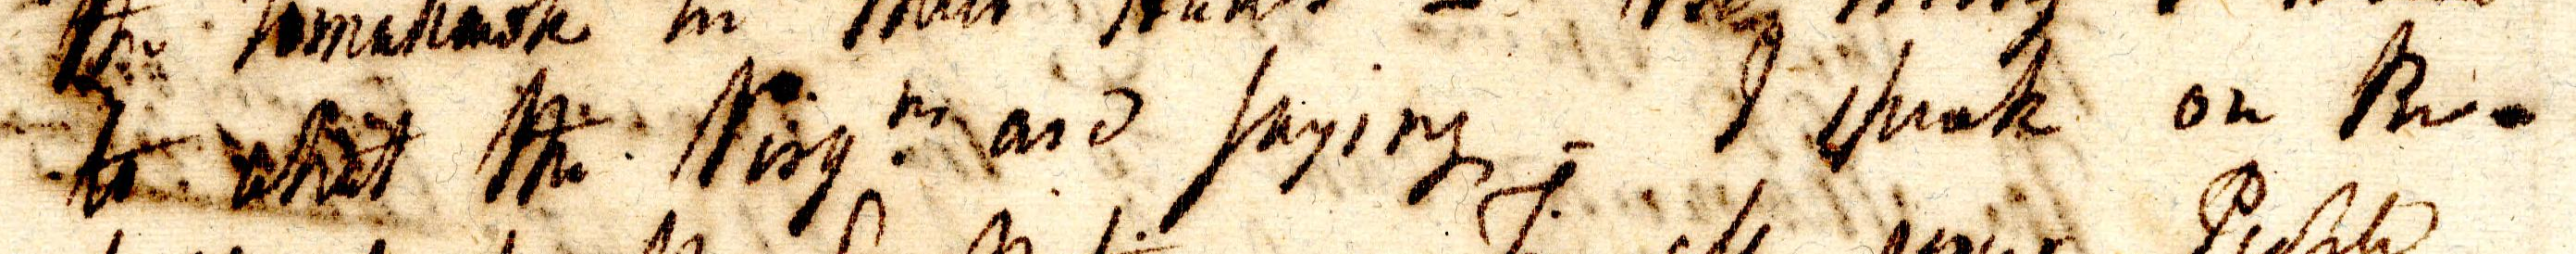to what the Virg^nas. are saying- I speak on Be-
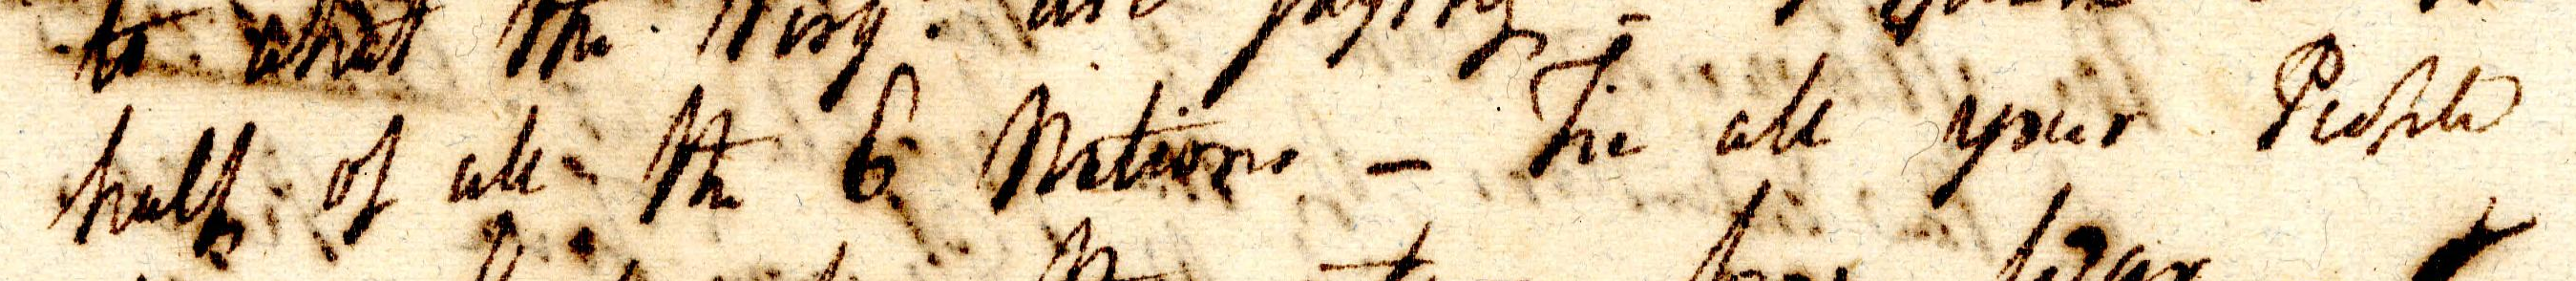half of all the 6 Nations- Tie all your People
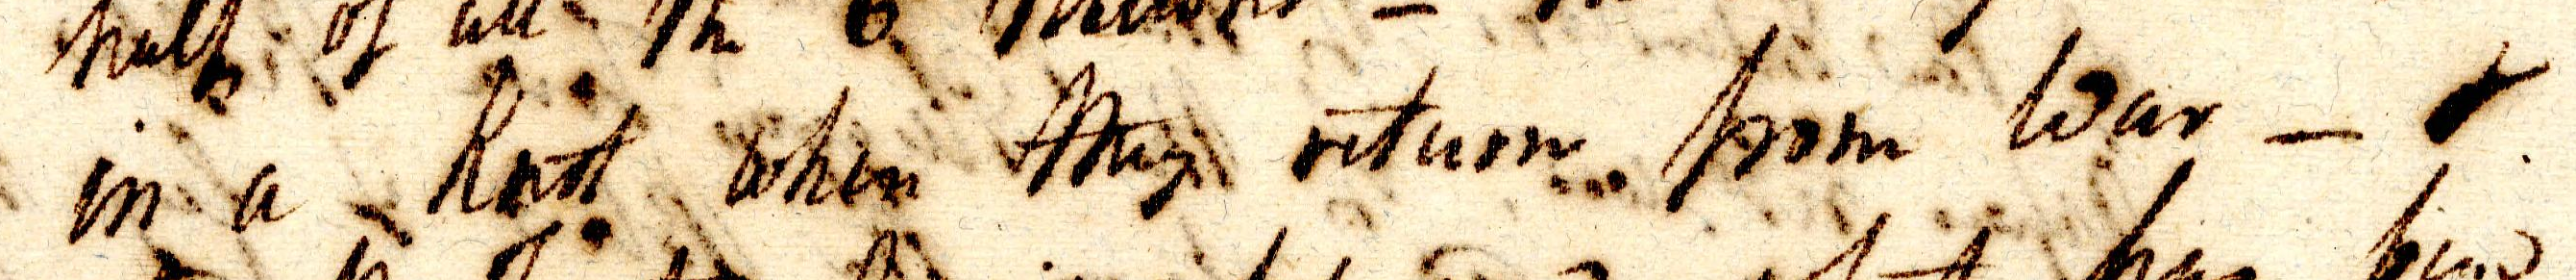in a Knot when they return from War- &
